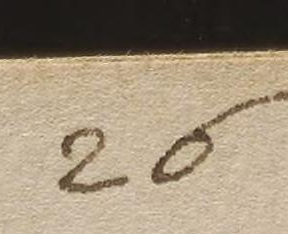26
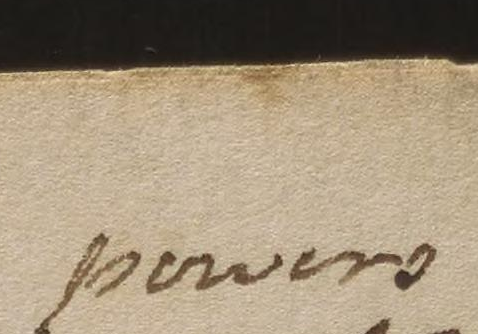powers
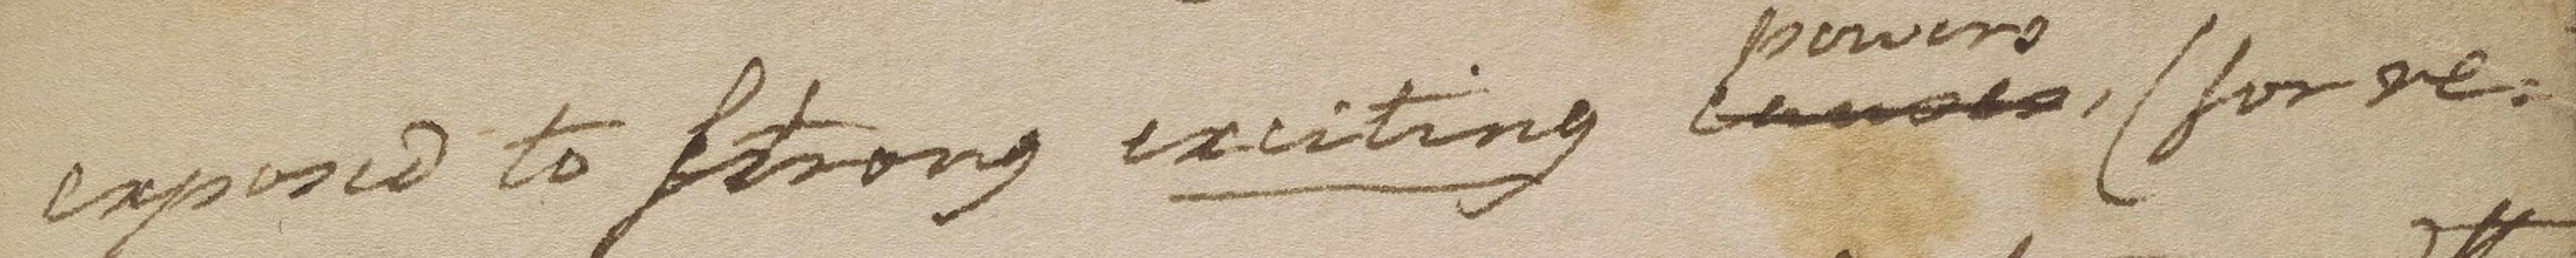exposed to Strong exciting [causes], (for re-
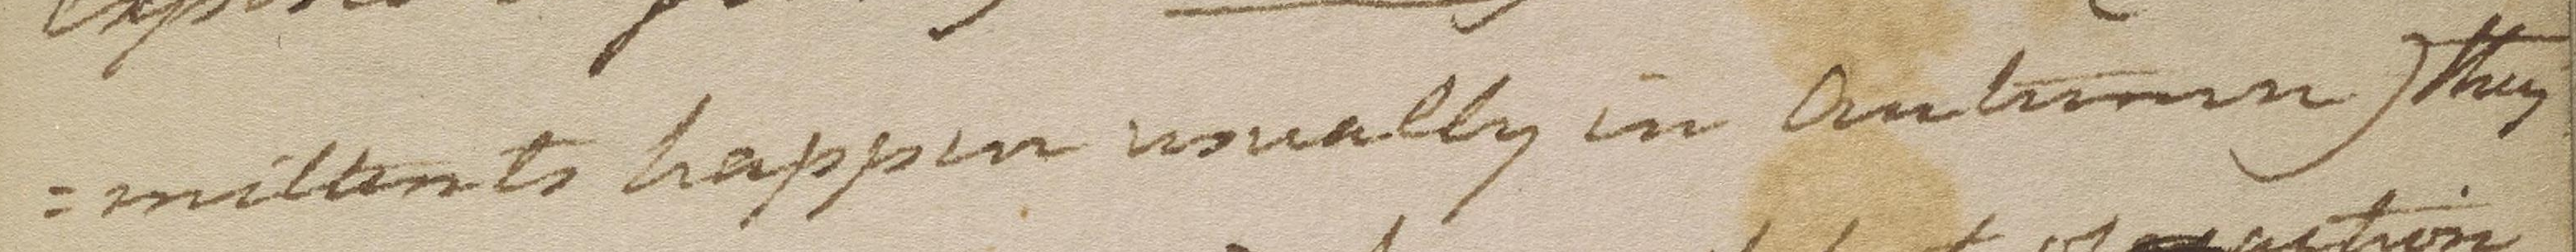mittents happen usually in Autumn) they
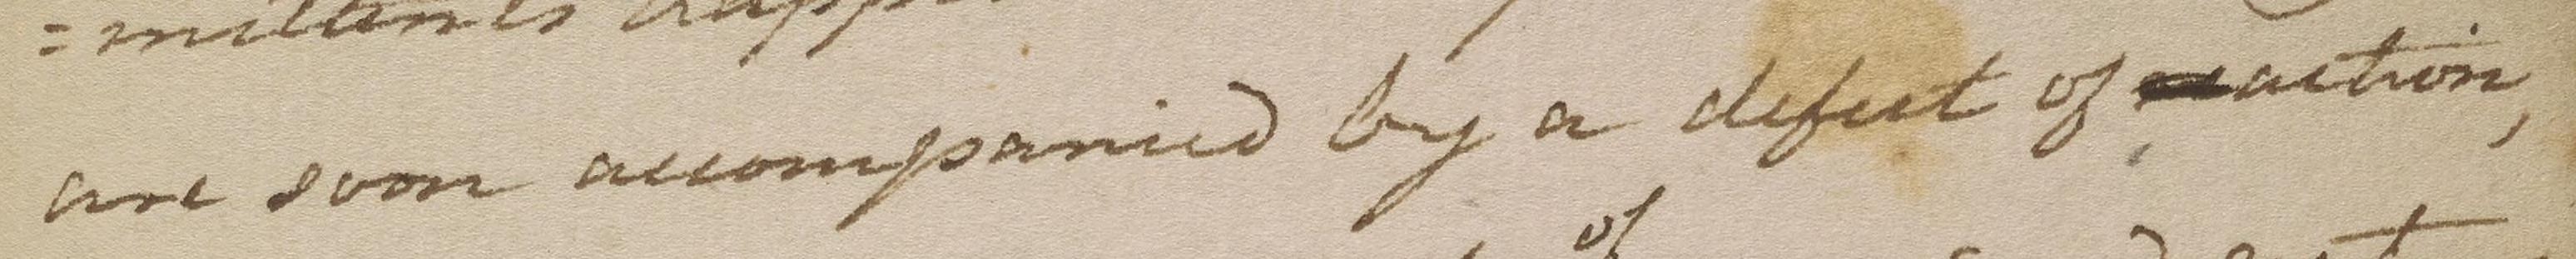are soon accompanied by a defect of [re]action,
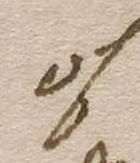of
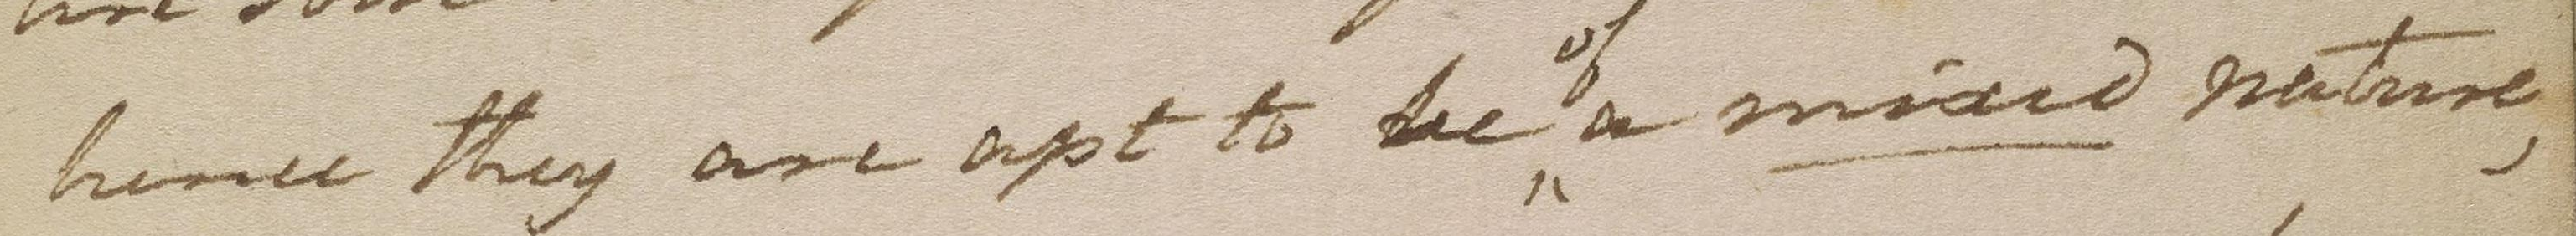hence they are apt to be ^ a mixed nature
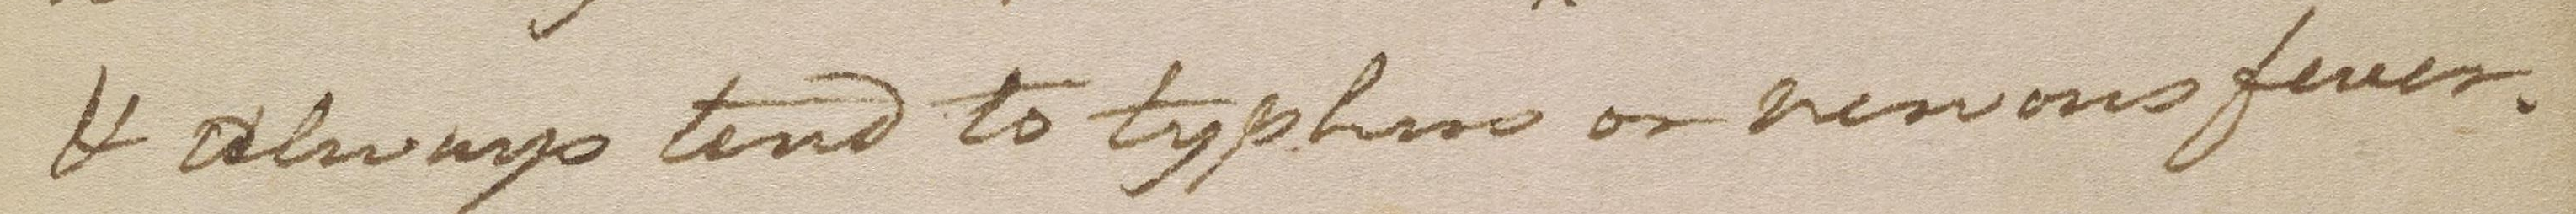& always tend to typhus or nervous fever.
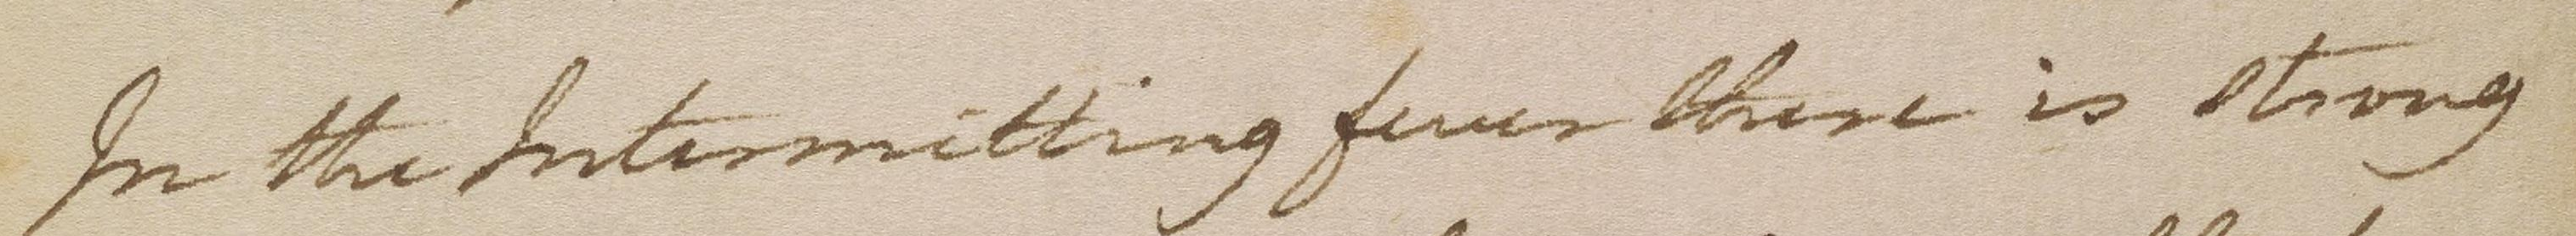In the Intermitting fever there is strong
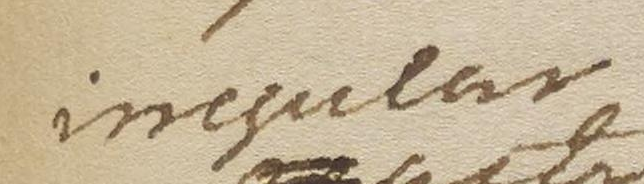irregular
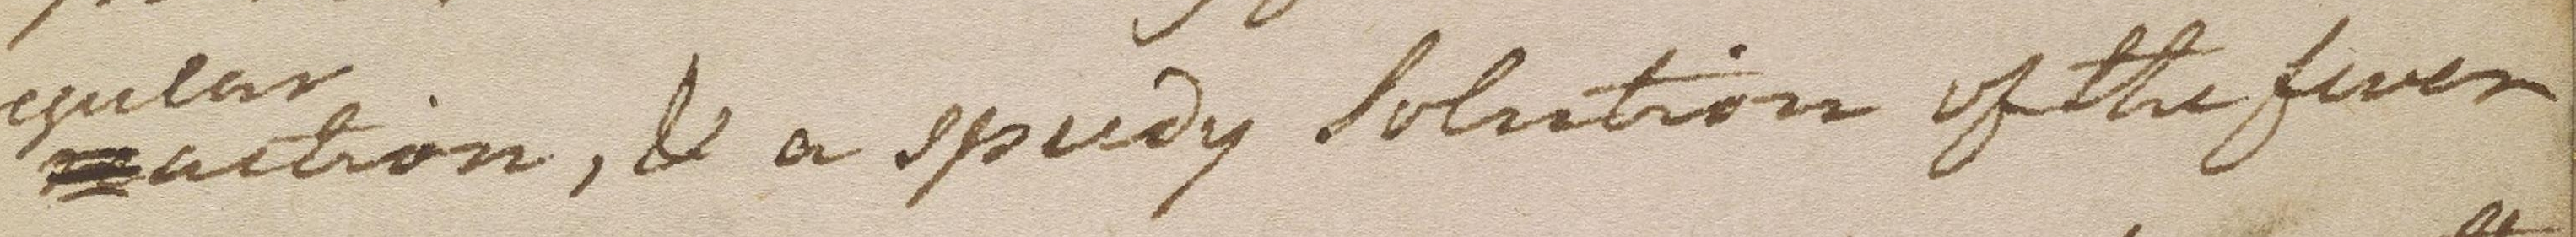[re]action, & a speedy solution of the fever
